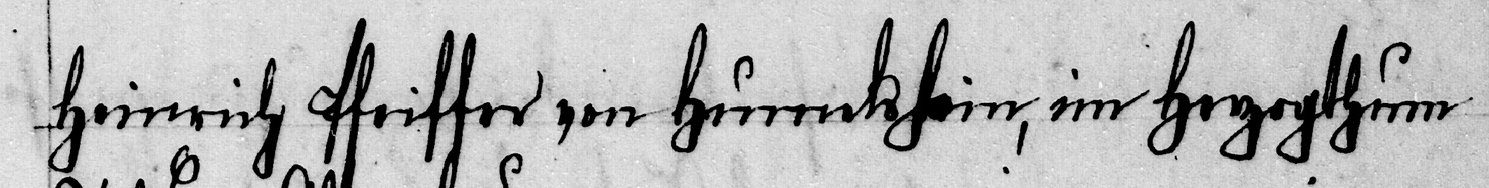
Heinrich Pfeiffer von Humelshain [sic!], im
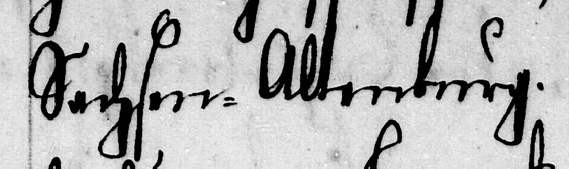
Sachsen-Altenburg.
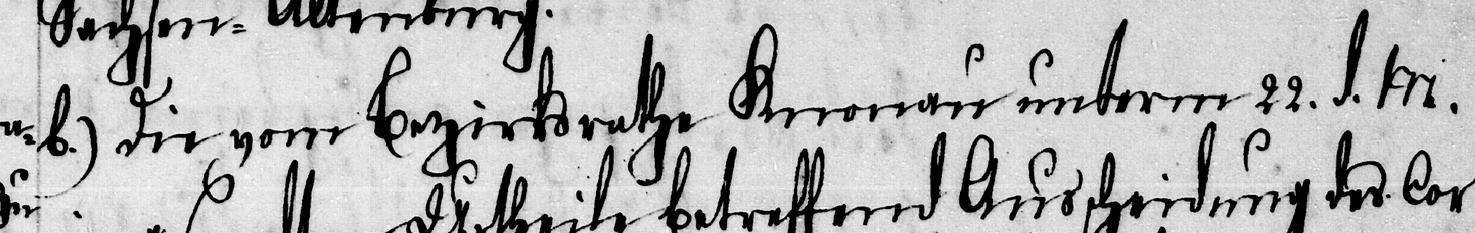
b.) Die vom Bezirksrathe Knonau unterm 22. d. M.
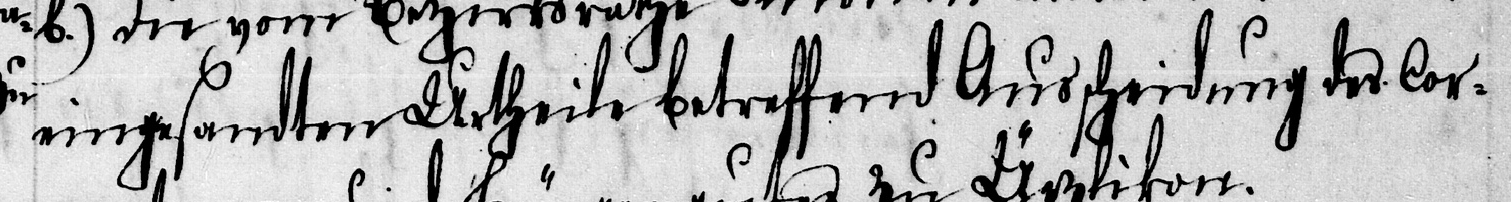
eingesandten Urtheile betreffend Ausscheidung des Cor¬
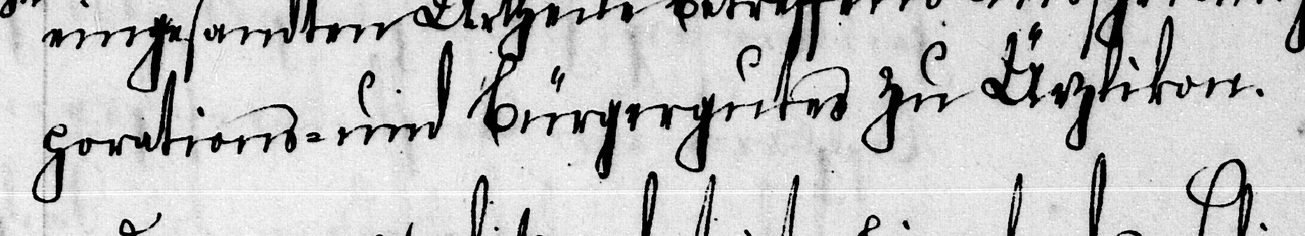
porations- und Bürgergutes zu Ürzlikon.
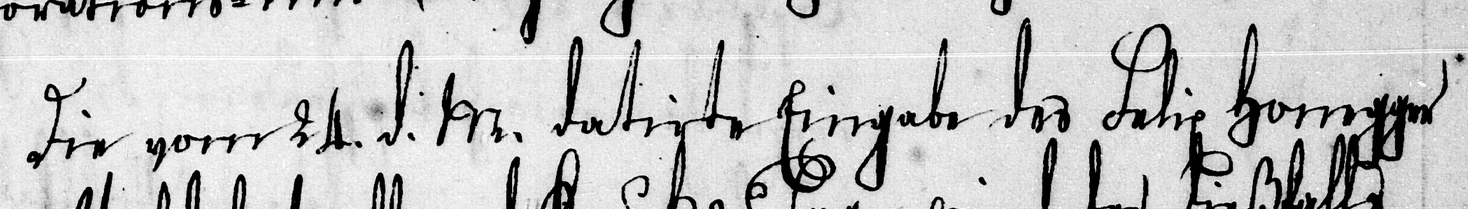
Die vom 24. d. M. datirte Eingabe des Felix Honegger
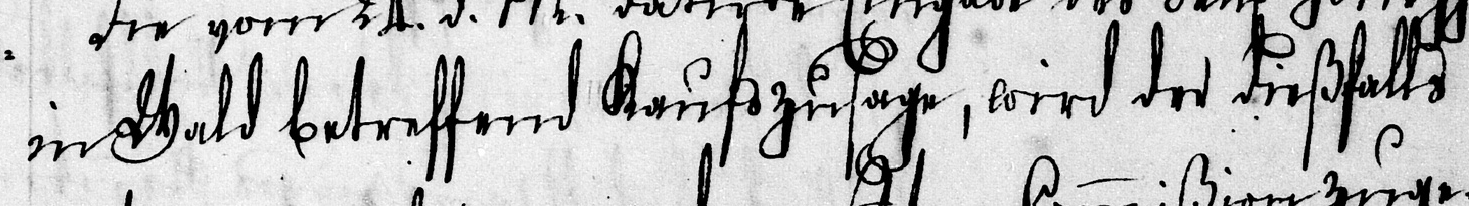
in Wald betreffend Kaufszusage, wird der dießfalls
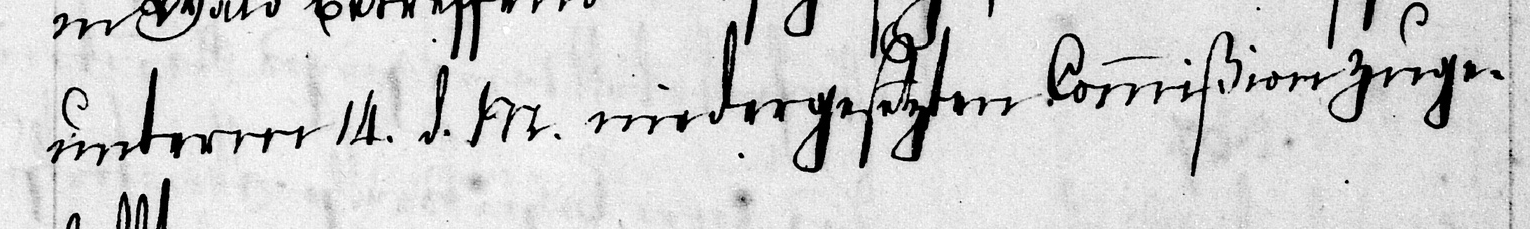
unterm 14. d. M. niedergesetzten Commißion zuge¬
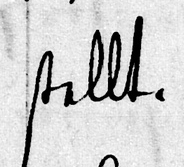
stellt.
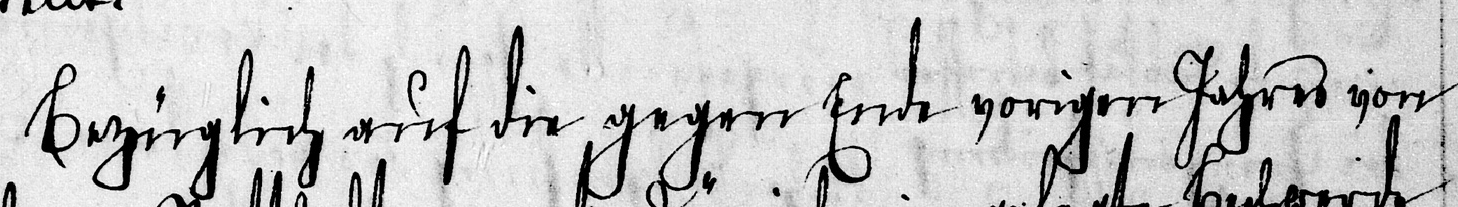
Bezüglich auf die gegen Ende vorigen Jahres von
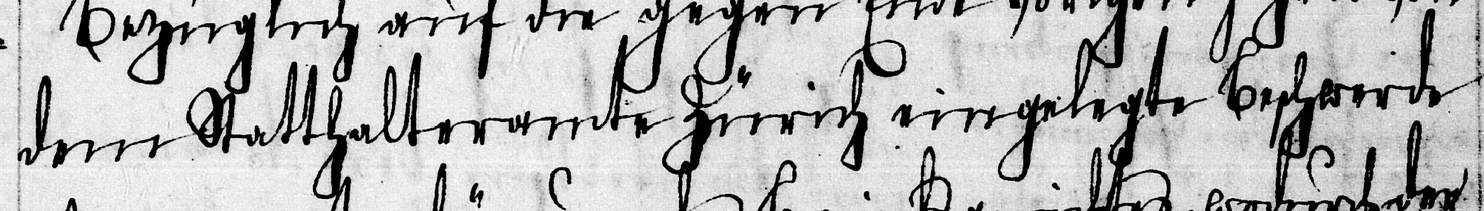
dem Statthalteramte Zürich eingelegte Beschwerde
